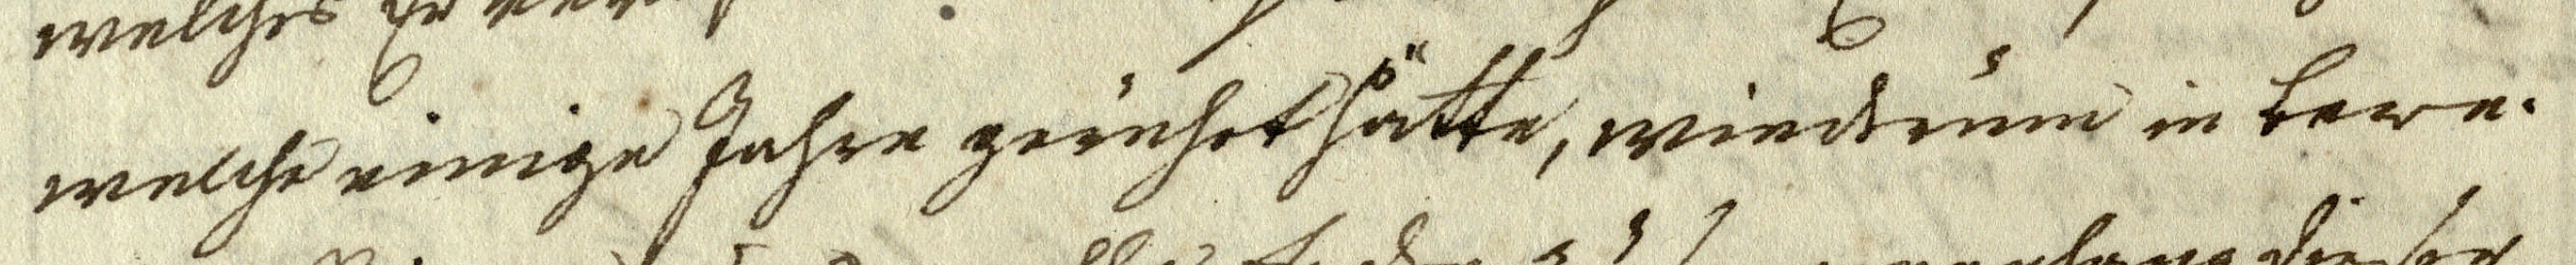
welche einige Jahre geruhet hätte,wiederum in Bewe¬
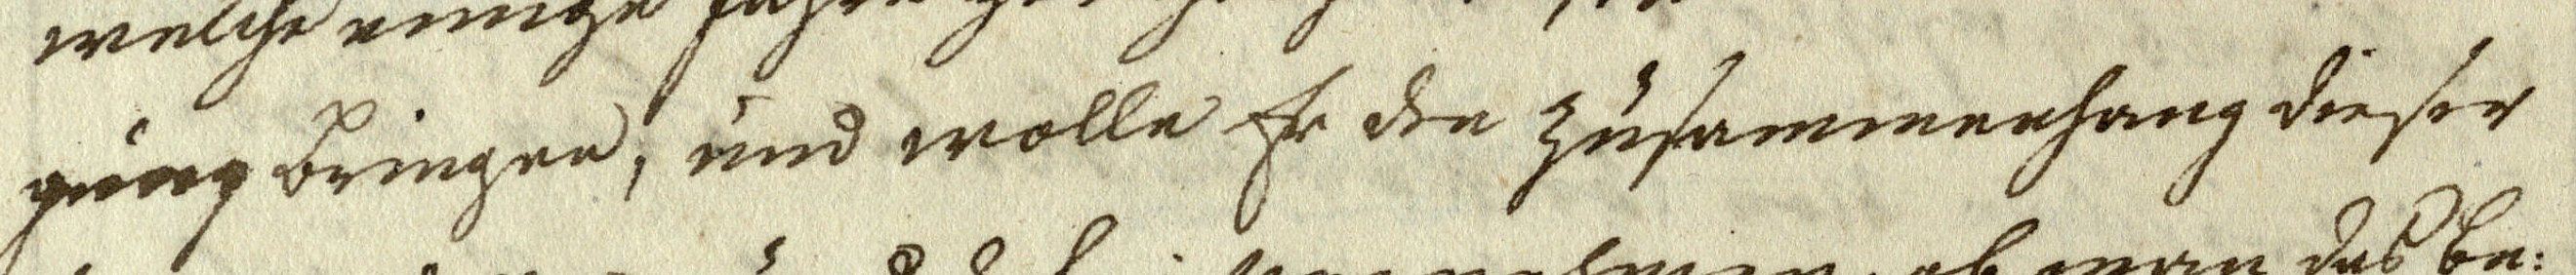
gung bringen, und wolle Er den Zusammenhang dieser
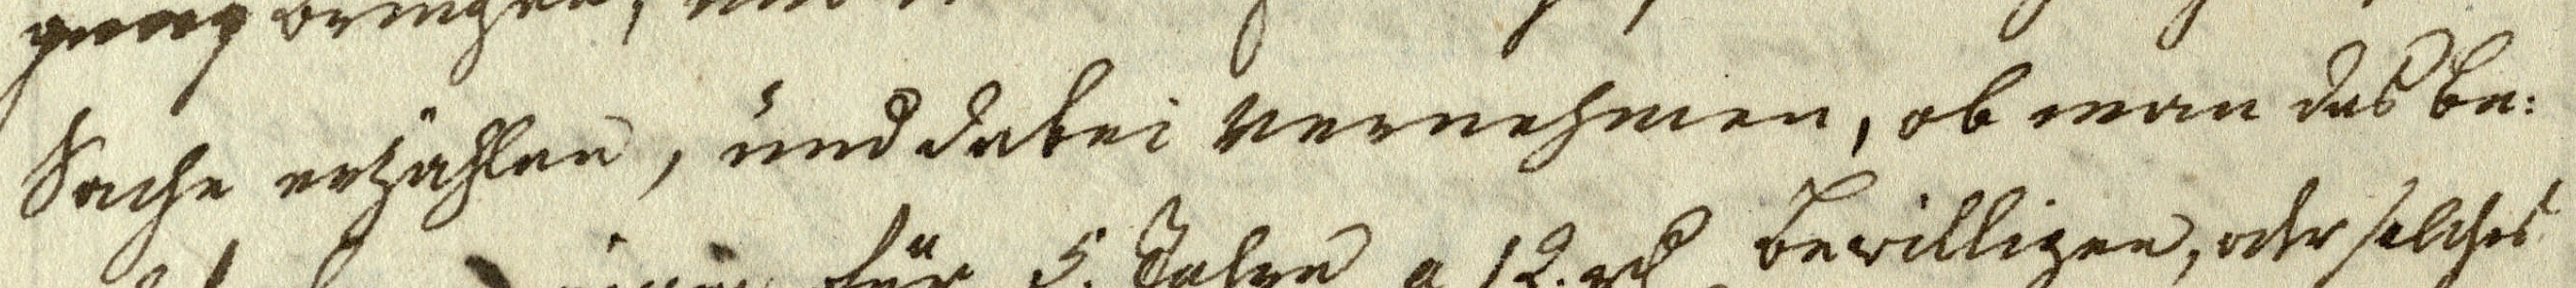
Sache erzählen, und dabei vernehmen, ob man das be¬
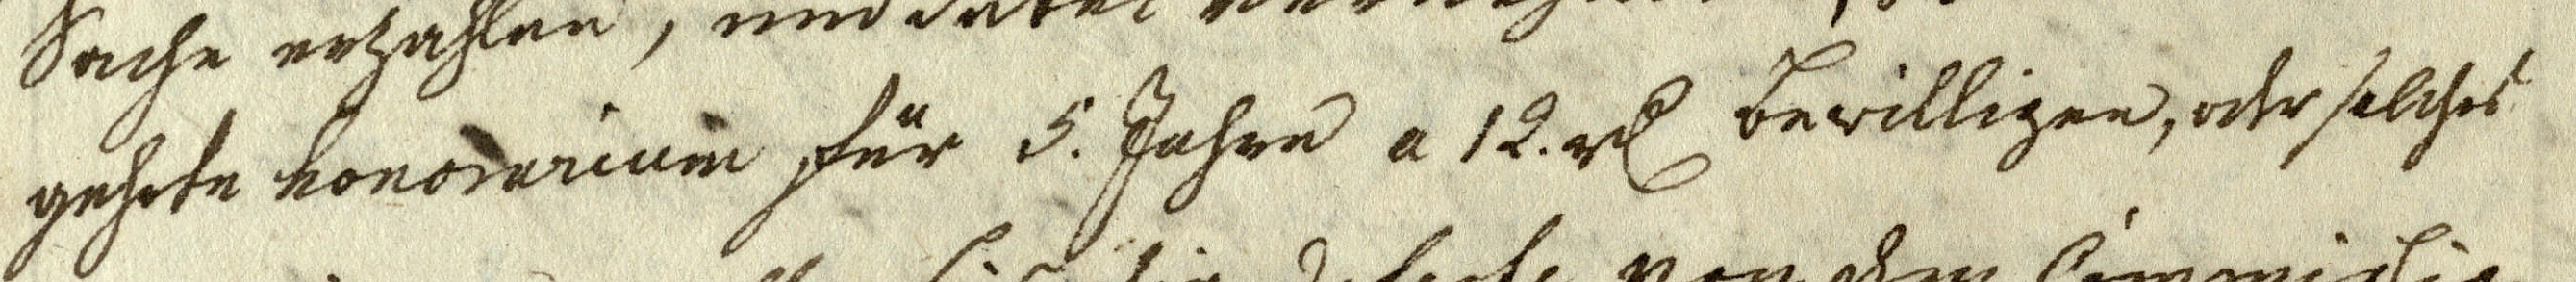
gehrte honorarium für 5. Jahre a 12. r. bewilligen oder solches
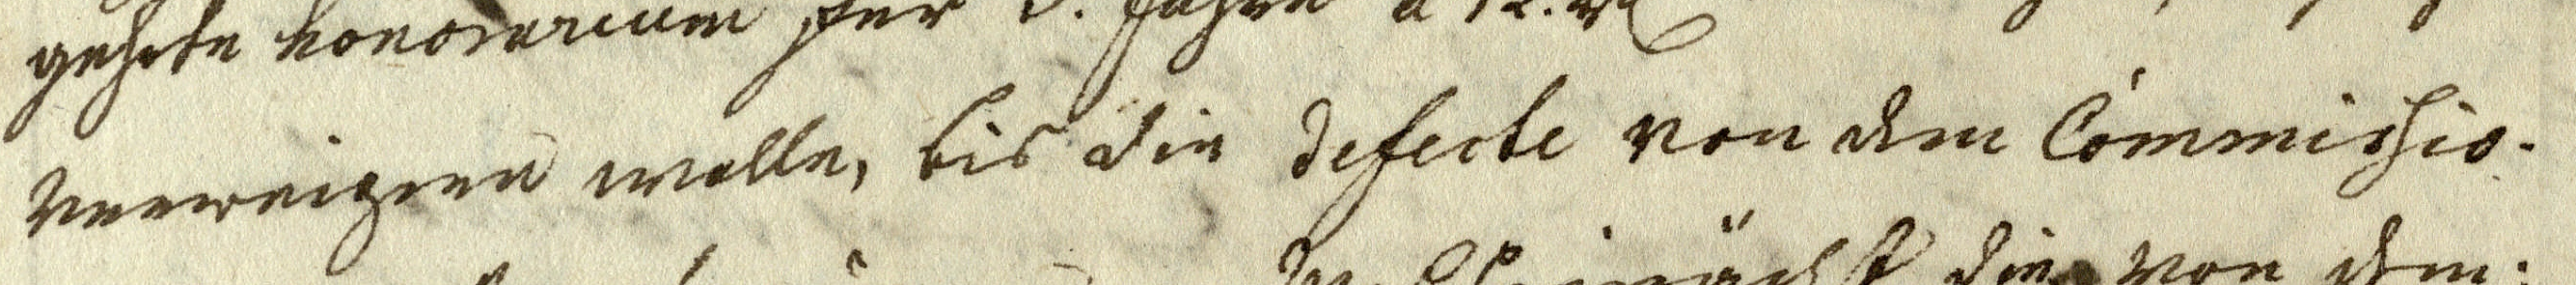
verweigern wolle, bis die defecte von dem Commissio¬
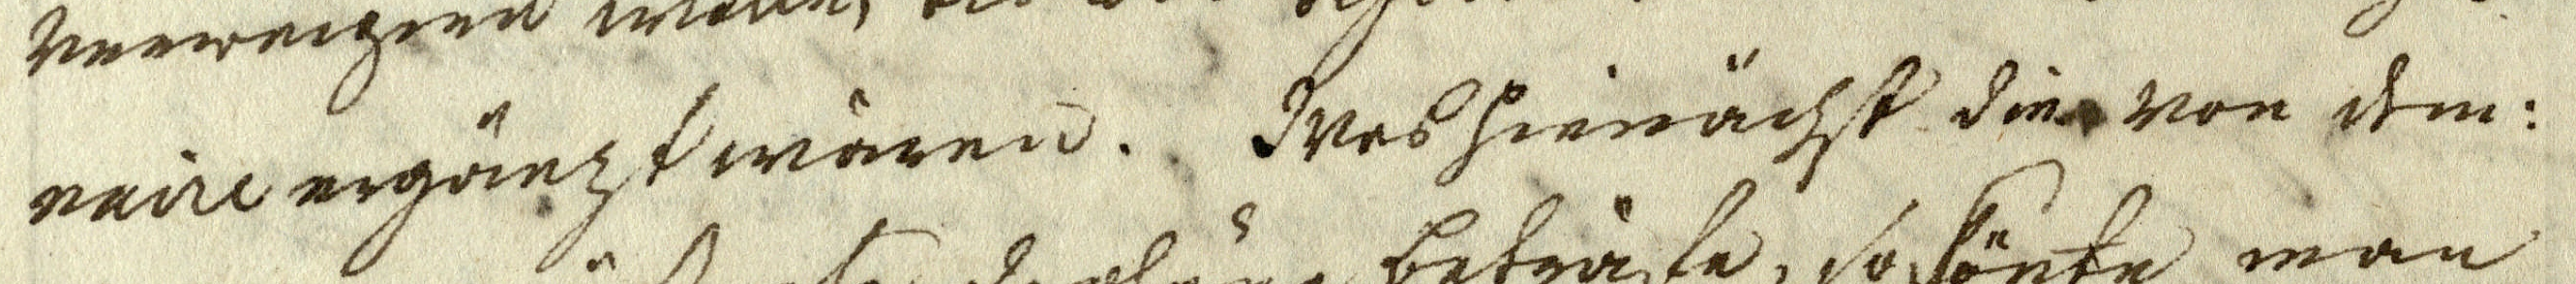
naire ergänzt wären. Was hienächst die von dem¬
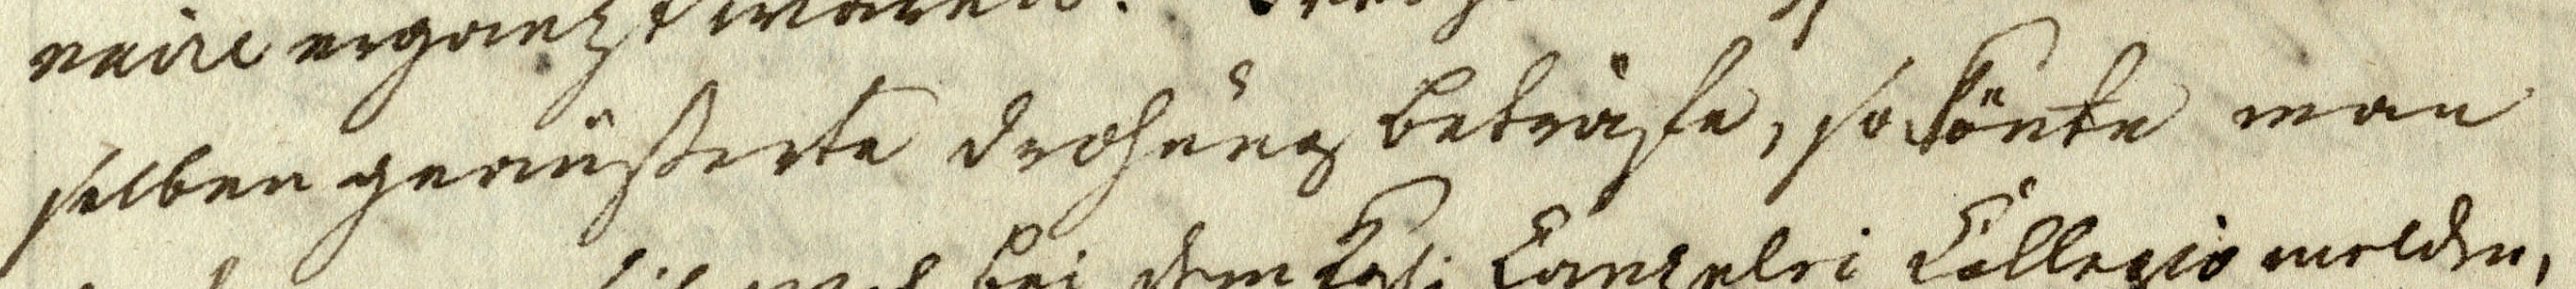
selben geäußerte Drohung beträfe, so könte man
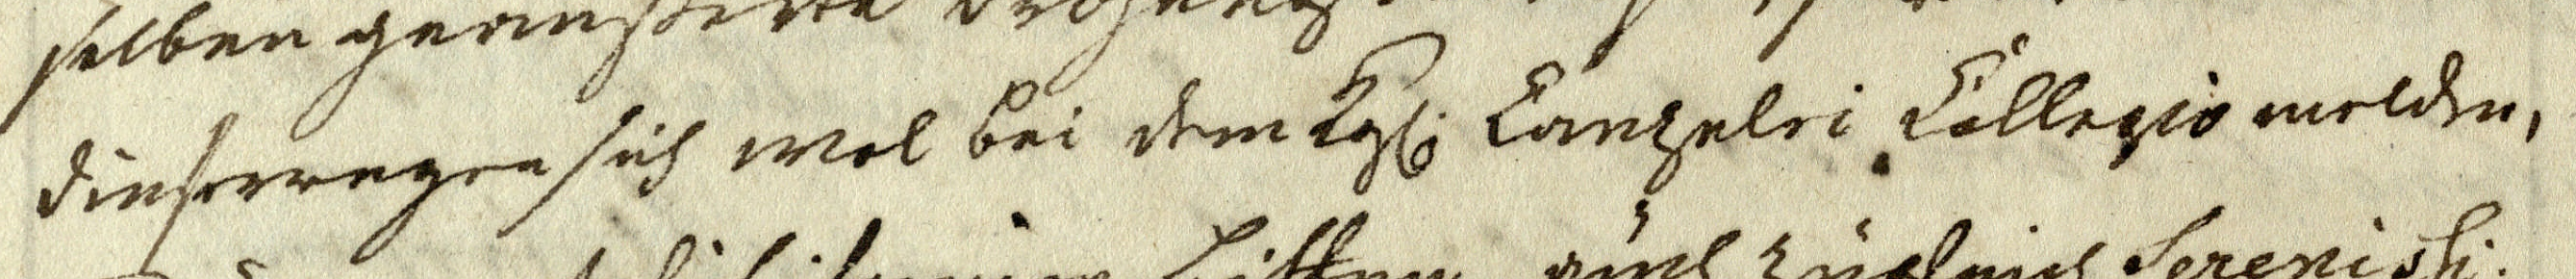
dieserwegen sich wol bei dem Kgl. Canzelei Collegio melden,
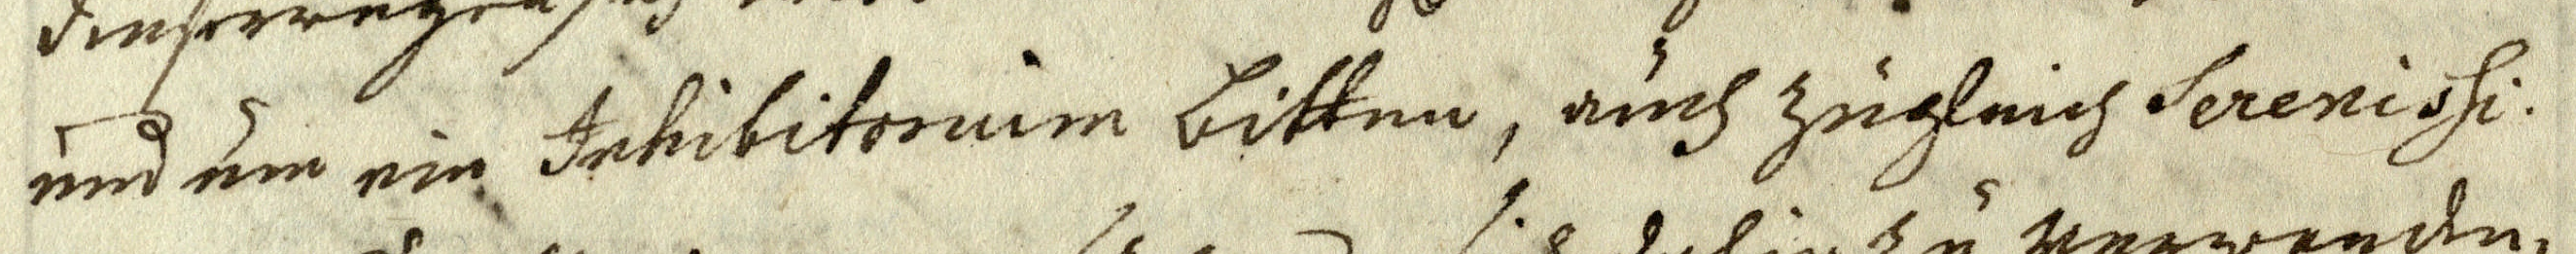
und um ein Inhibitorium bitten, auch zugleich Serenissi¬
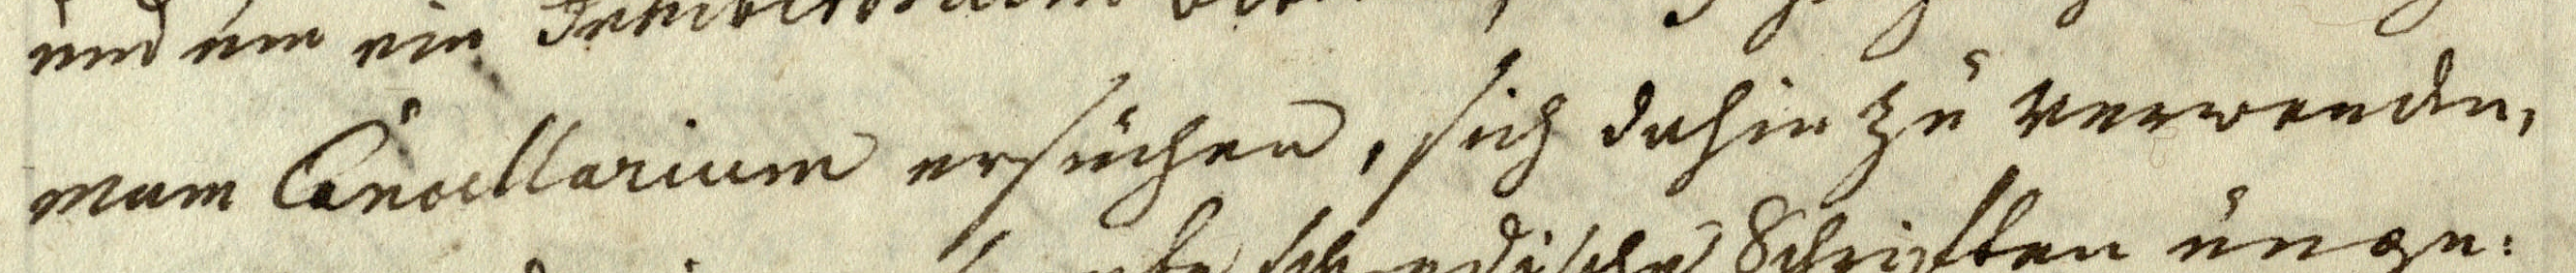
mum Cancellarium ersuchen, sich dahin zu verwenden,
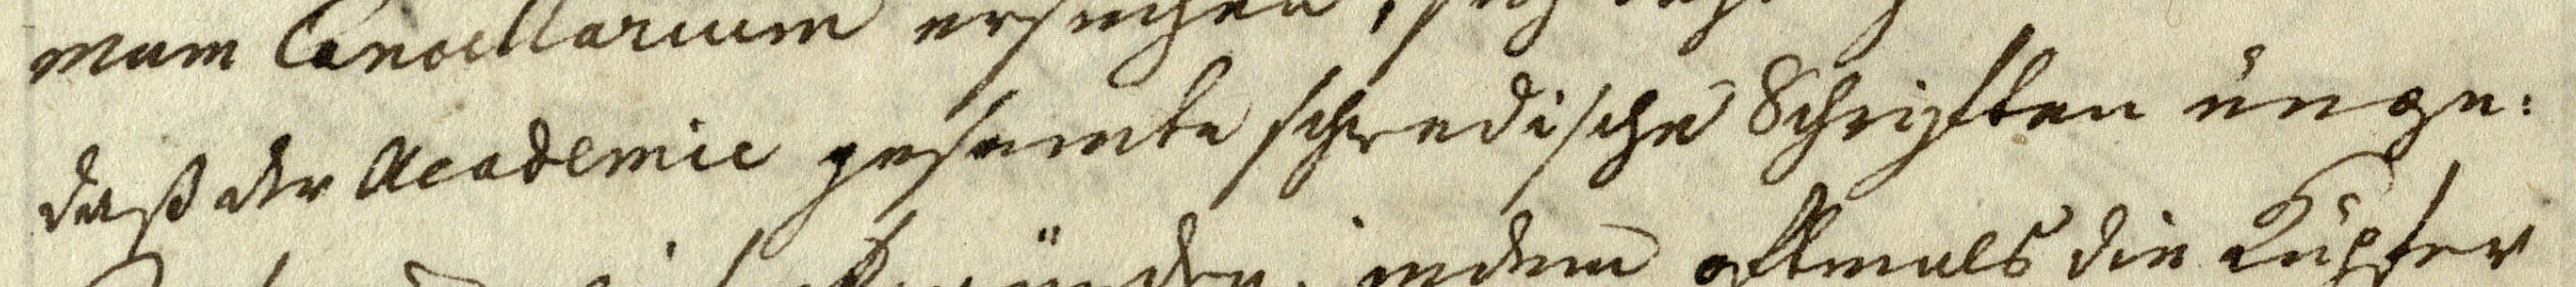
daß der Academie gesandte schwedische Schriften unge¬
